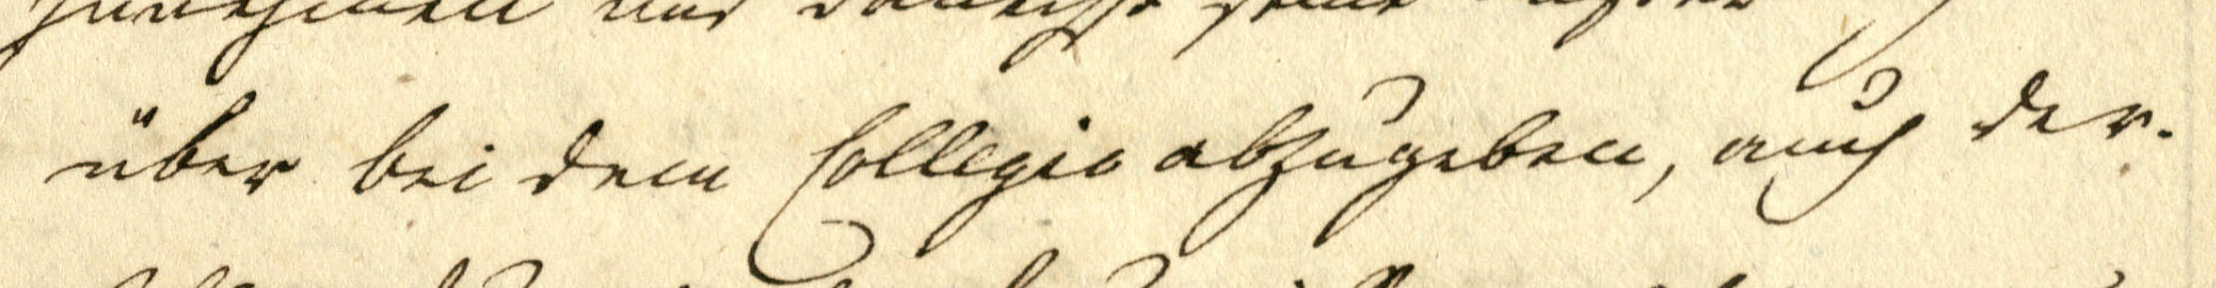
über bei dem Collegio abzugeben, auch der¬
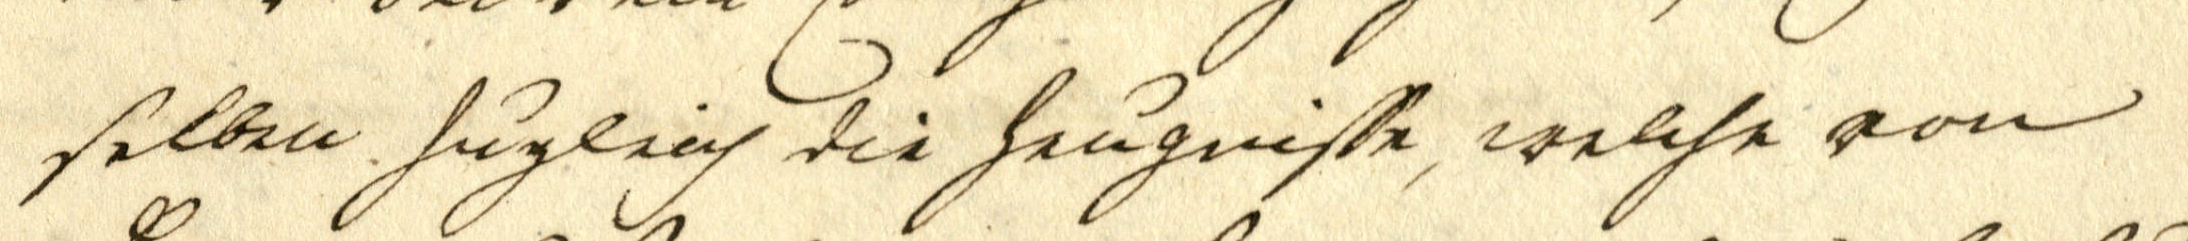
selben zugleich die Zeugnisse, welche von
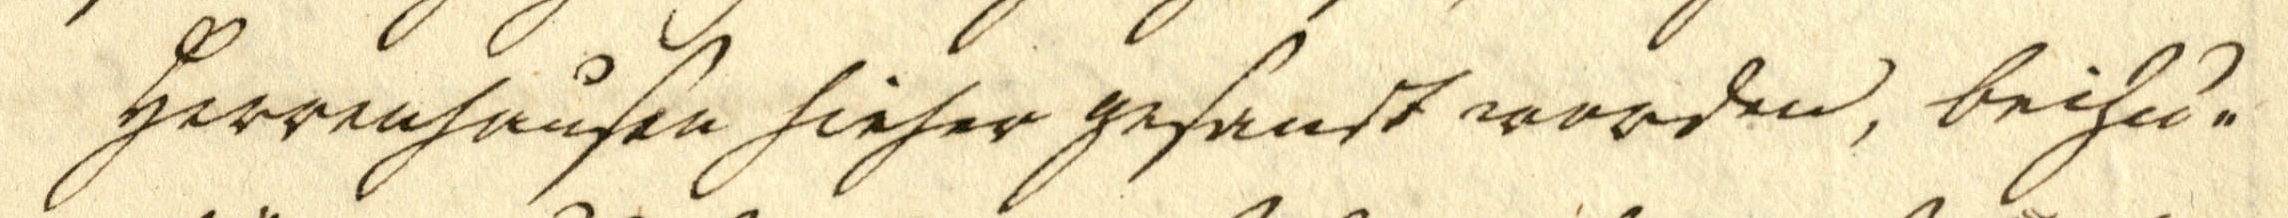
Herrenhausen hieher gesandt worden, beizu¬
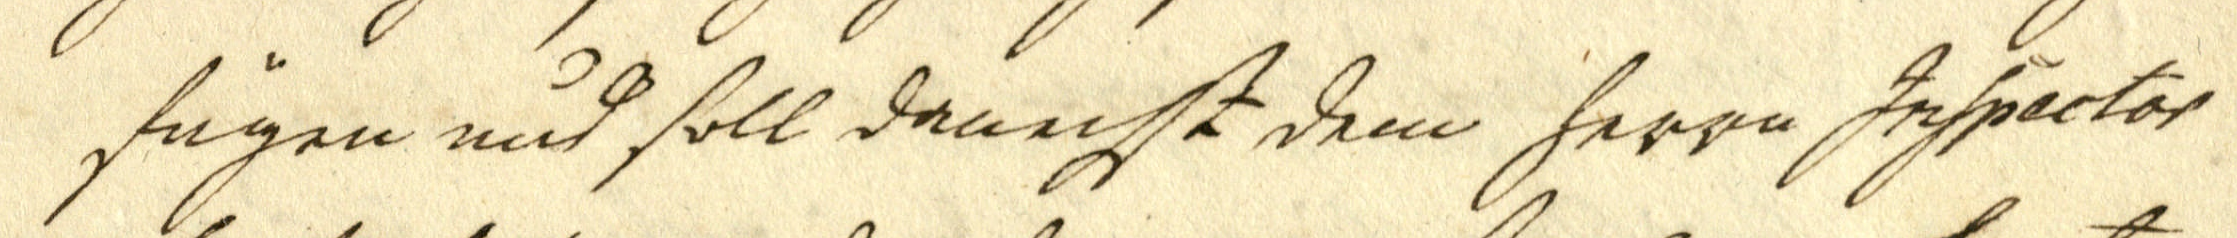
fügen und soll danechst dem herrn Inspector
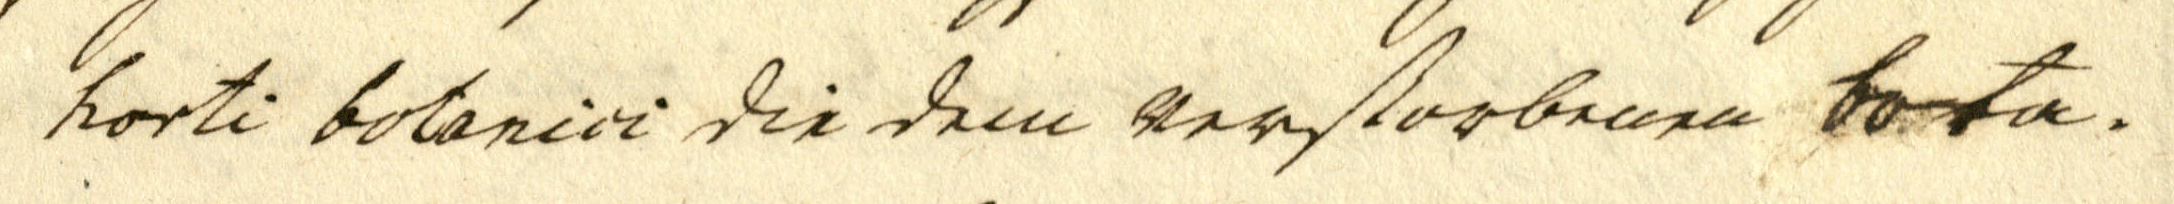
horti botanici die dem verstorbenen bota¬
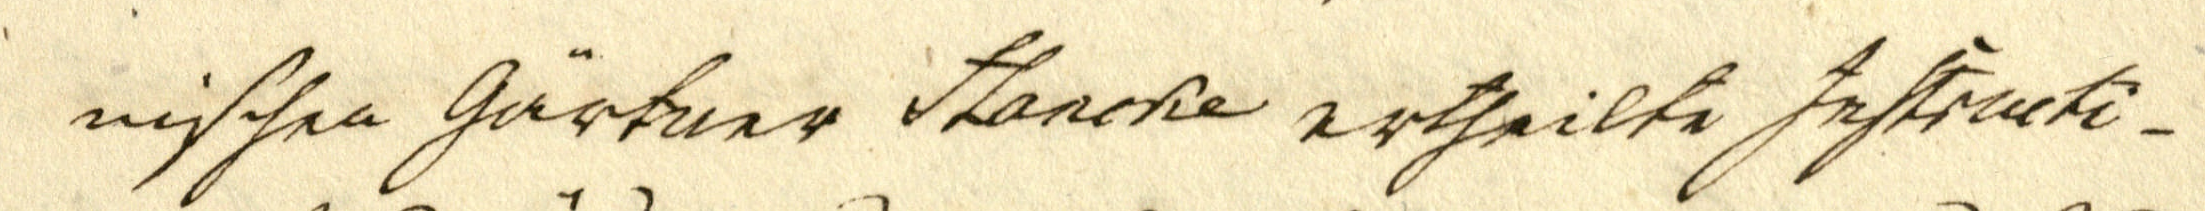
nischen Gärtner Hancke ertheilte Instructi¬
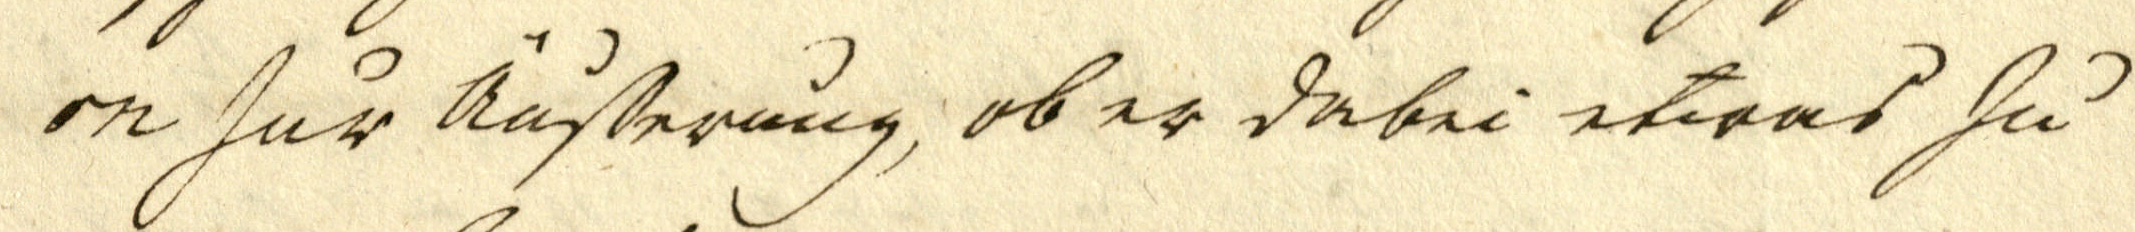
on zur Äusserung, ob er dabei etwas zu
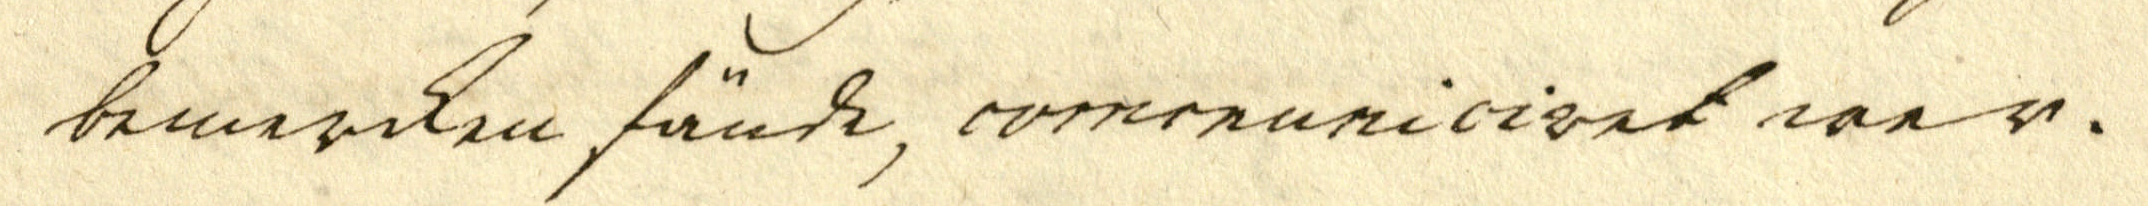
bemercken fände, communiciret wer¬
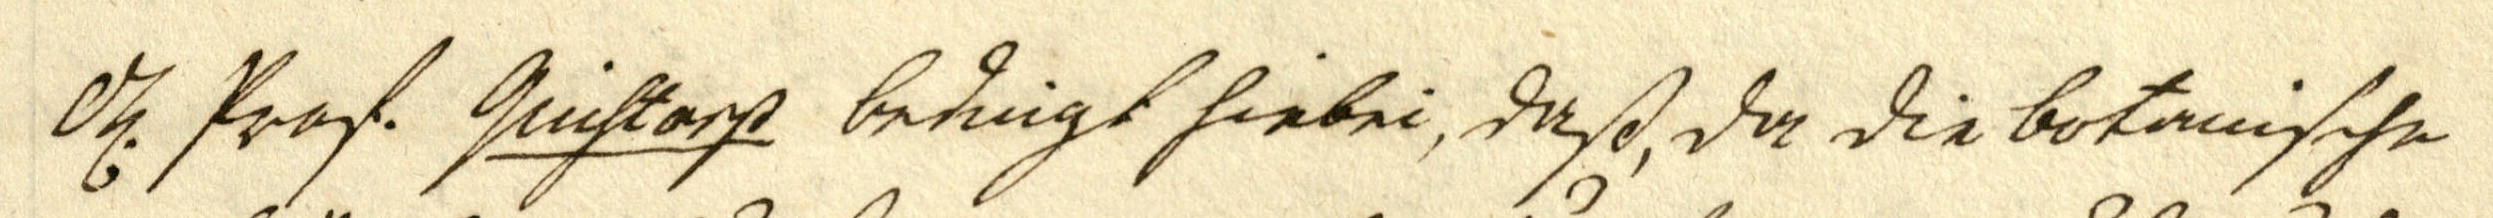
dh. Prof. Quistorp bedingt hiebei, daß, da die botanische
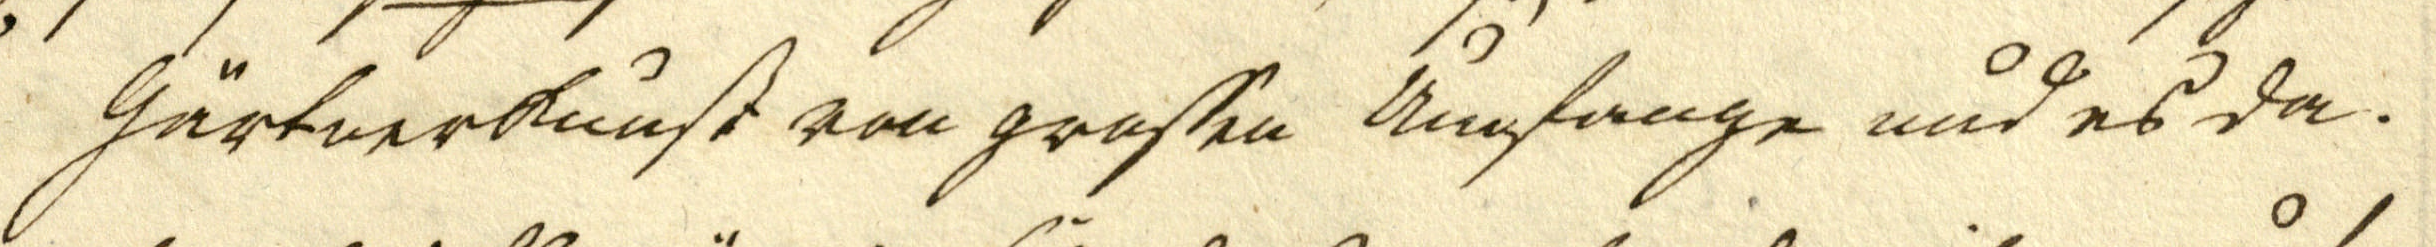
GärtnerKunst von grossen Umfange und es da¬
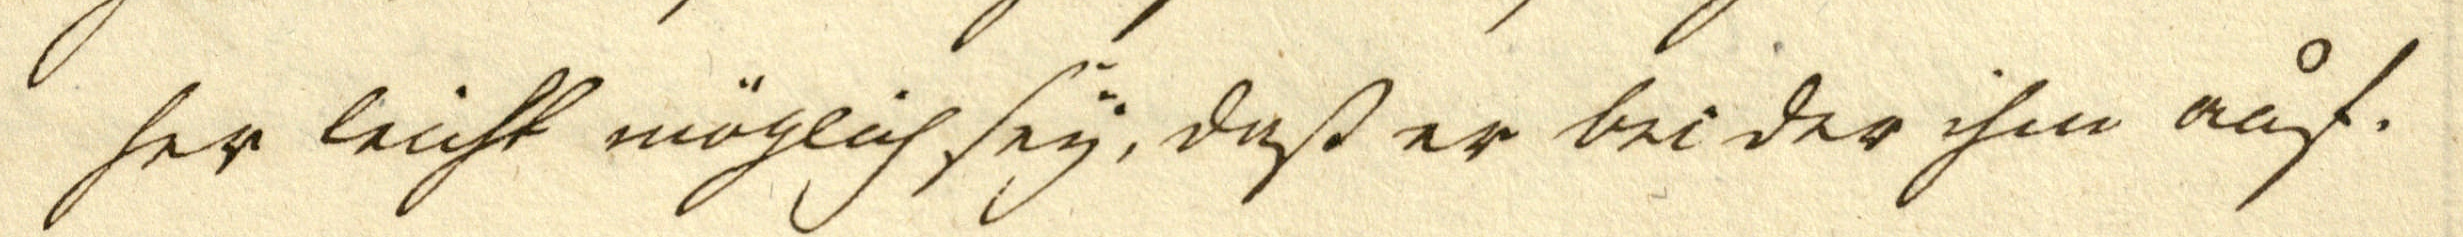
her leicht möglich seÿ, daß er bei der ihm auf¬
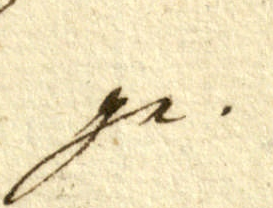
ge
